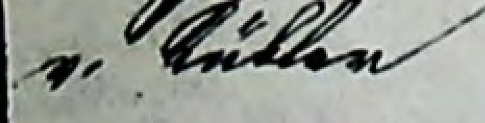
v. Kübler
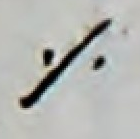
./.
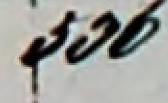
536
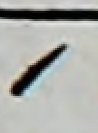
1
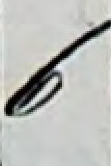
6
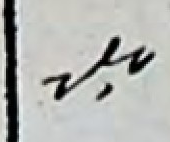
do
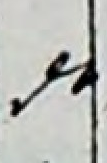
do
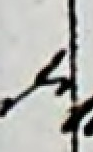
do
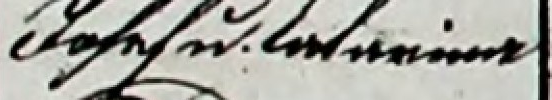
Josef u. Calarina
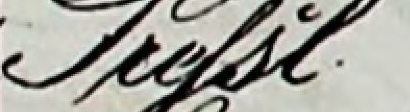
Pressl.
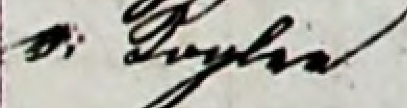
v. Logler
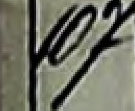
107
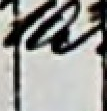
103
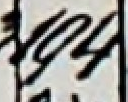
194
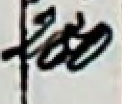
280
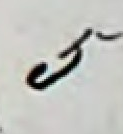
5
